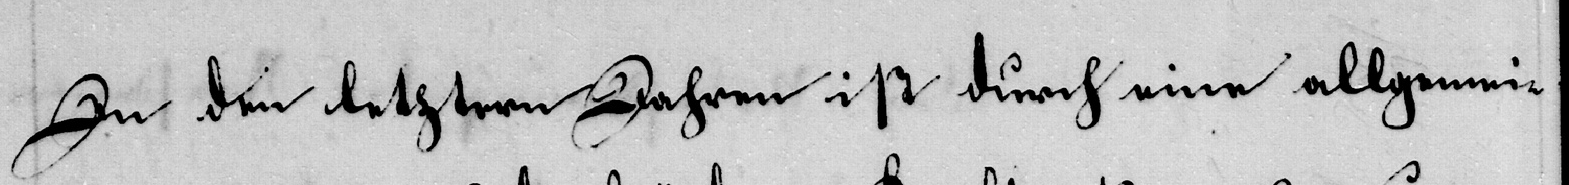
In den letztern Jahren ist durch eine allgemei¬
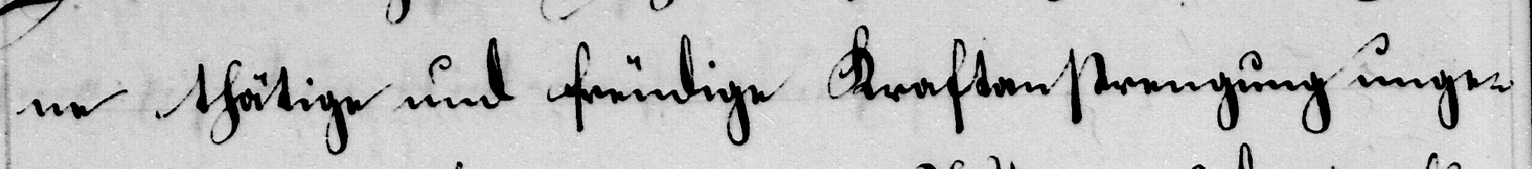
ne thätige und freudige Kraftanstrengung unge¬
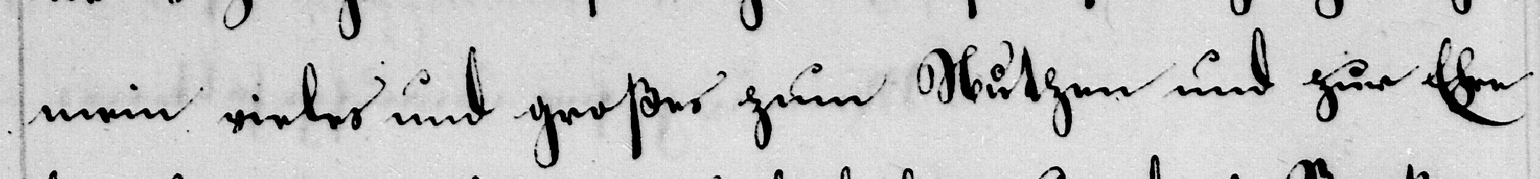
mein vieles und großes zum Nutzen und zur Ehre
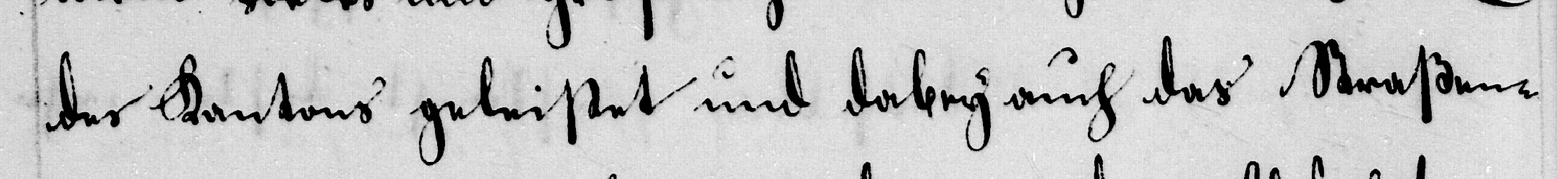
des Kantons geleistet und dabey auch das Straßen¬
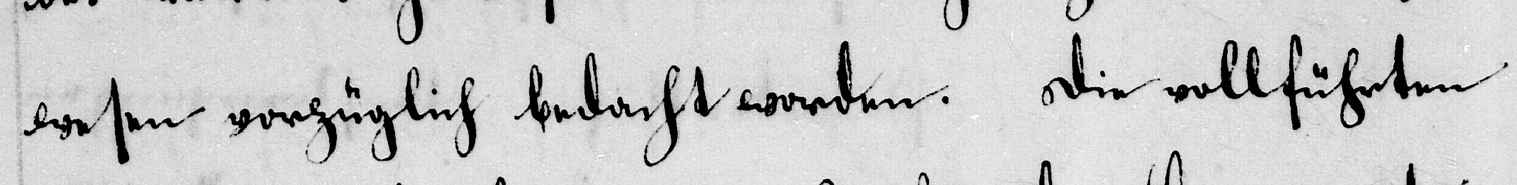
wesen vorzüglich bedacht worden. Die vollführten
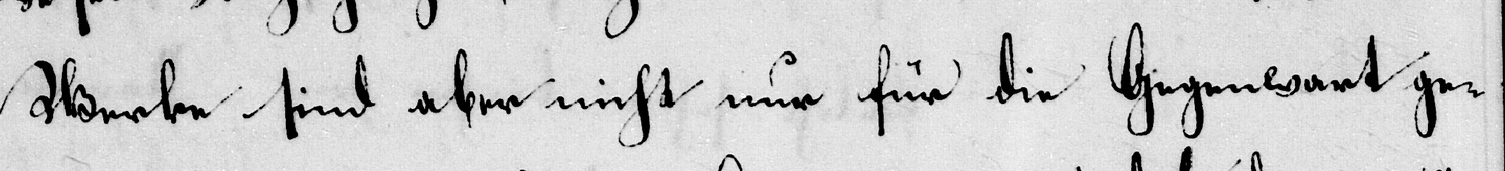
Werke sind aber nicht nur für die Gegenwart ge¬
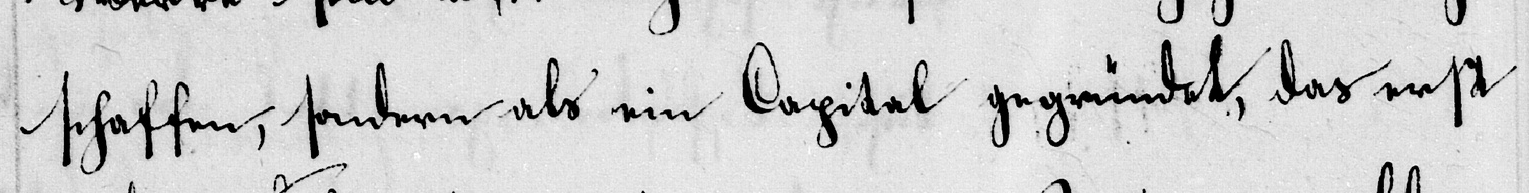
schaffen, sondern als ein Capital gegründet, das erst
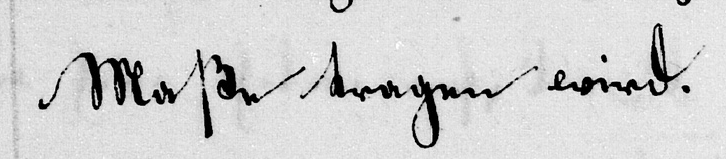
Maße tragen wird.
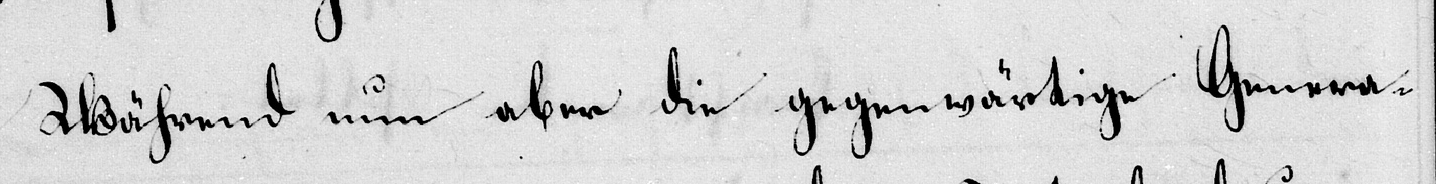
Während nun aber die gegenwärtige Genera¬
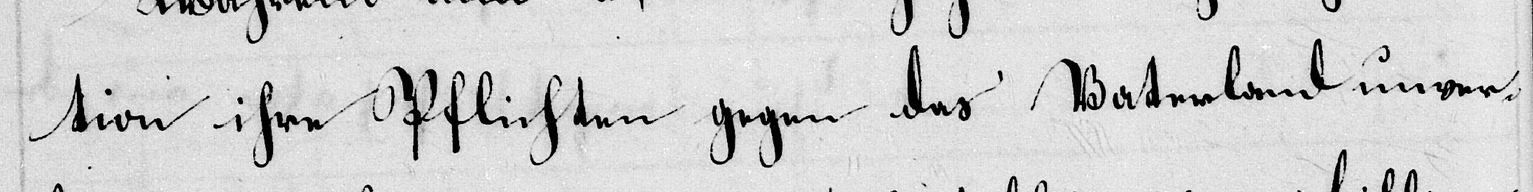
tion ihre Pflichten gegen das Vaterland unver¬
